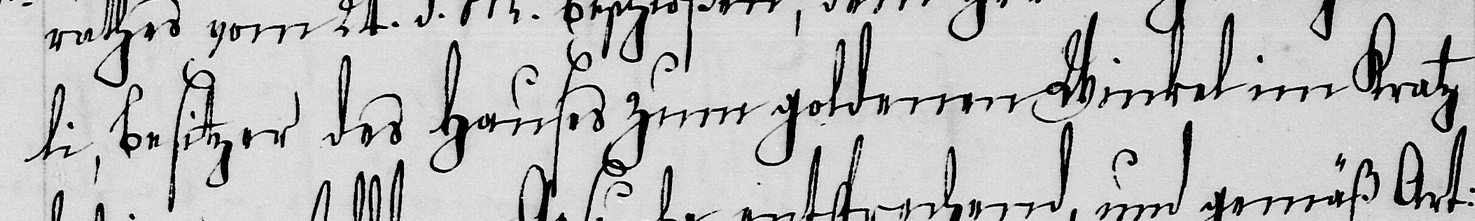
li, Besitzer des Hauses zum goldenen Winkel im Kratz
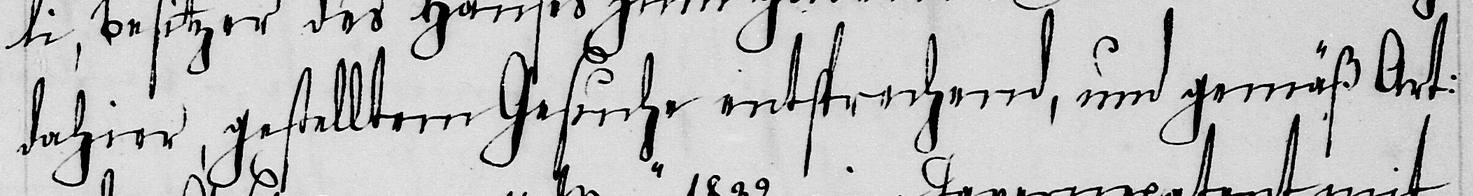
dahier, gestelltem Gesuche entsprechend, und gemäß Art:
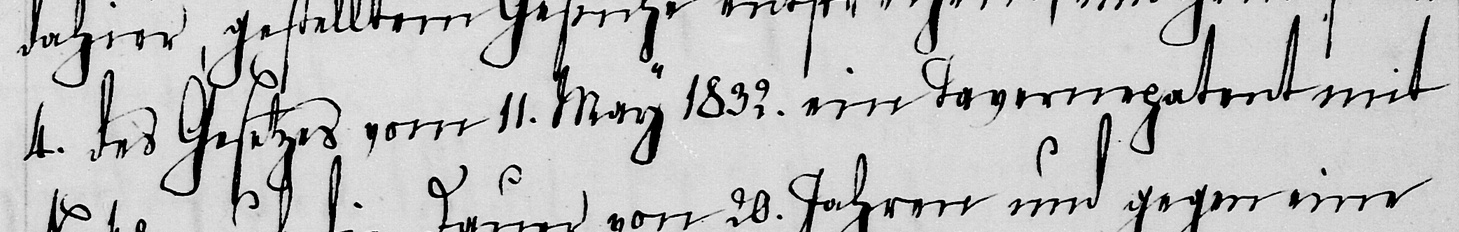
4. des Gesetzes vom 11. May 1832. ein Tavernepatent mit
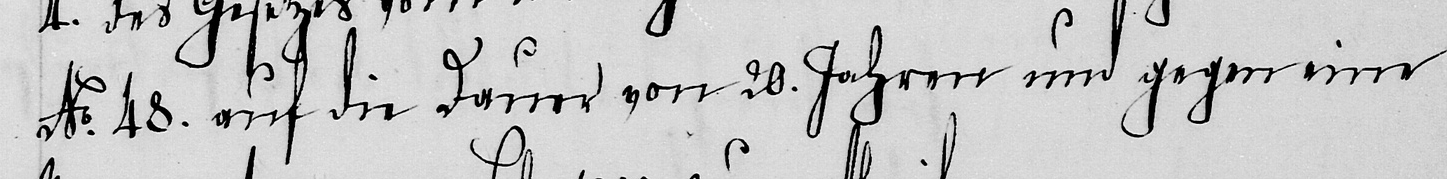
No. 48. auf die Dauer von 20. Jahren und gegen eine
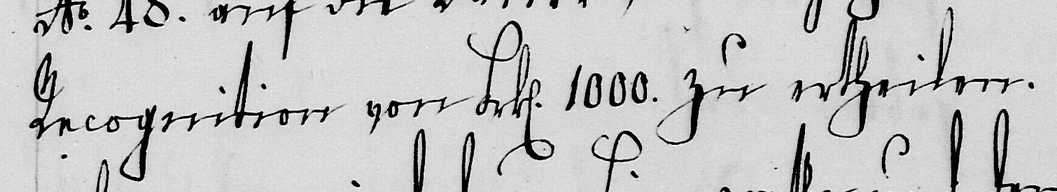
Recognition von Frk[en]. 1000. zu ertheilen.
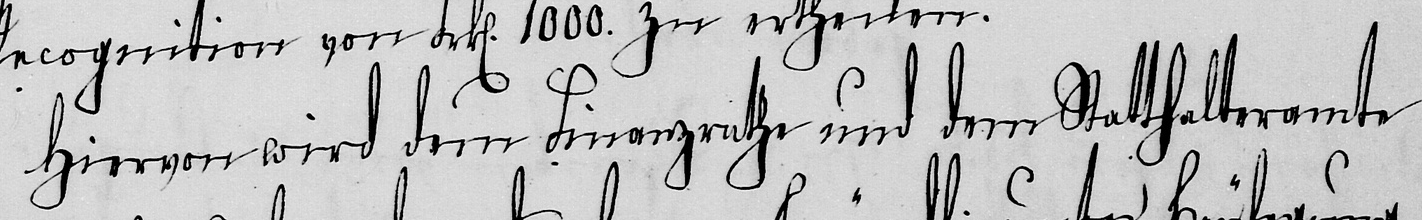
Hiervon wird dem Finanzrathe und dem Statthalteramte
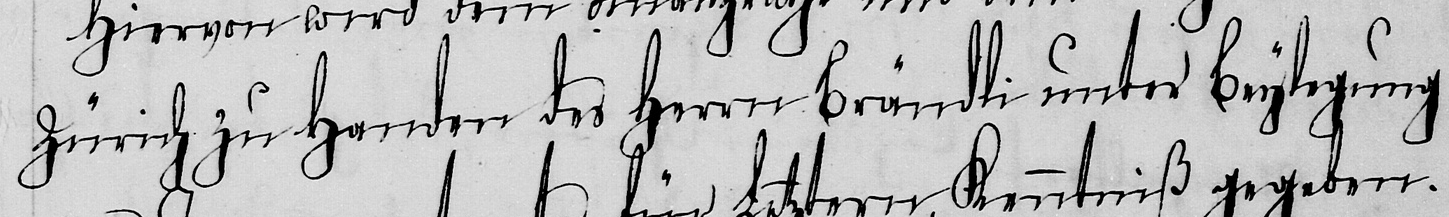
Zürich zu Handen des Herrn Brändli unter Beylegung
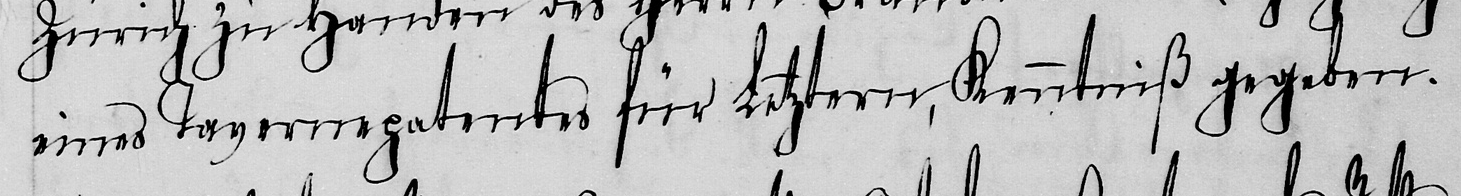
eines Tavernepatentes für Letztern, Kenntniß gegeben.
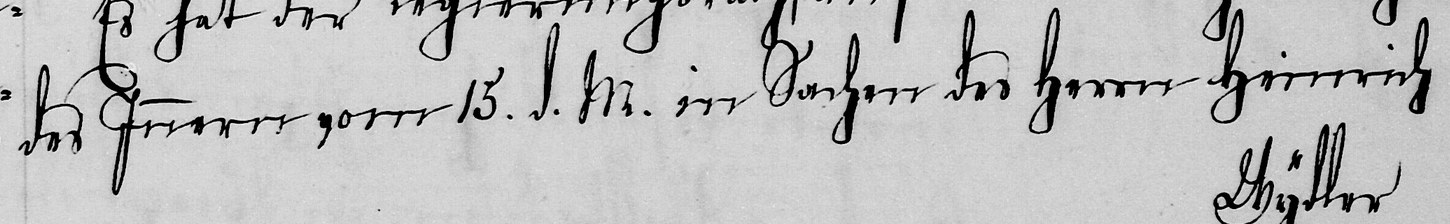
des Innern vom 15. d. M. in Sachen des Herrn Heinrich
